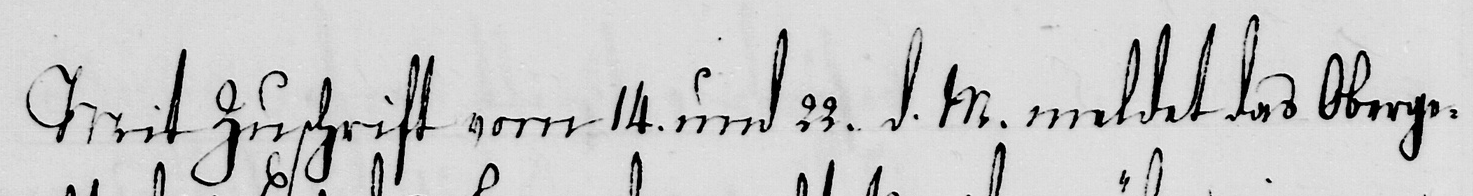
Mit Zuschrift vom 14. und 22. d. M. meldet das Oberge¬
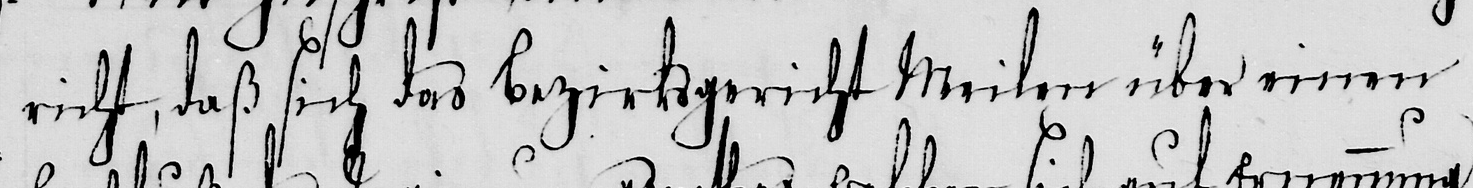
richt, daß sich das Bezirksgericht Meilen über einen
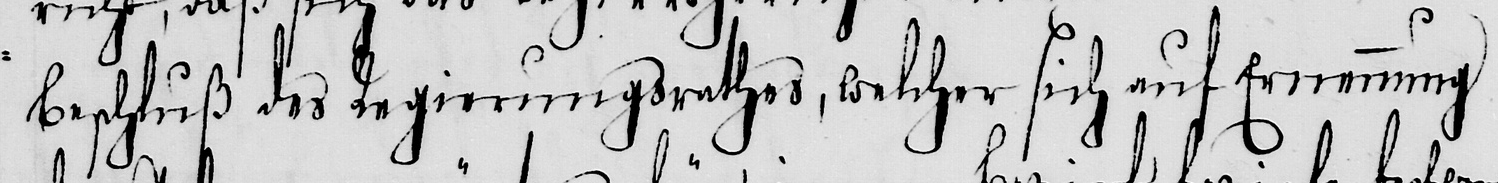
Beschluß des Regierungsrathes, welcher sich auf Ernennung
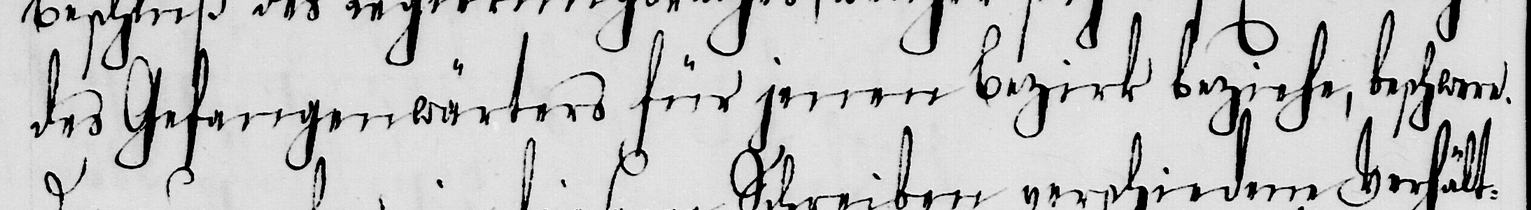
des Gefangenwärtes für jenen Bezirk beziehe, beschwer¬
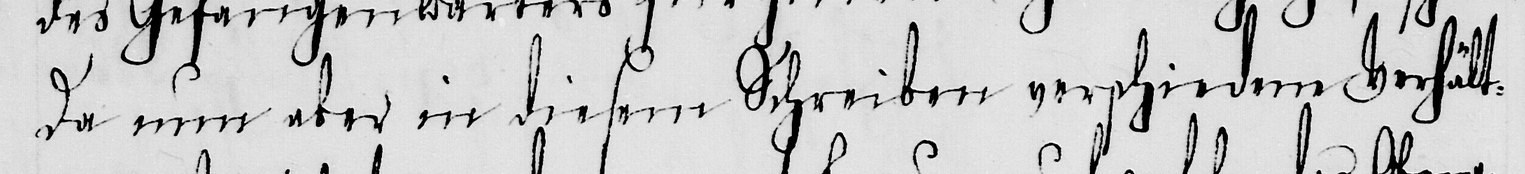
Da nun aber in diesem Schreiben verschiedene Verhält¬
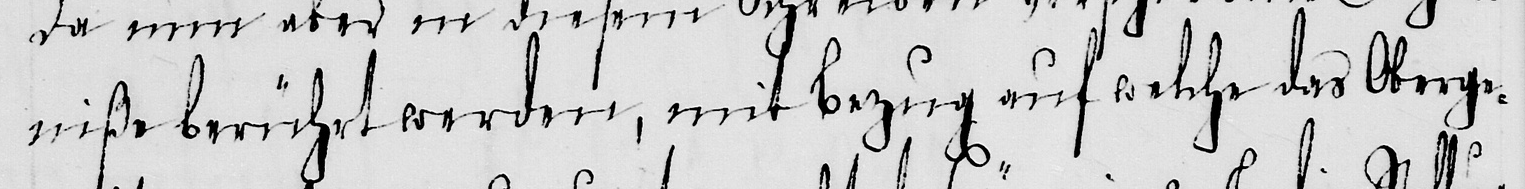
niße berührt werden, mit Bezug auf welche das Oberge¬
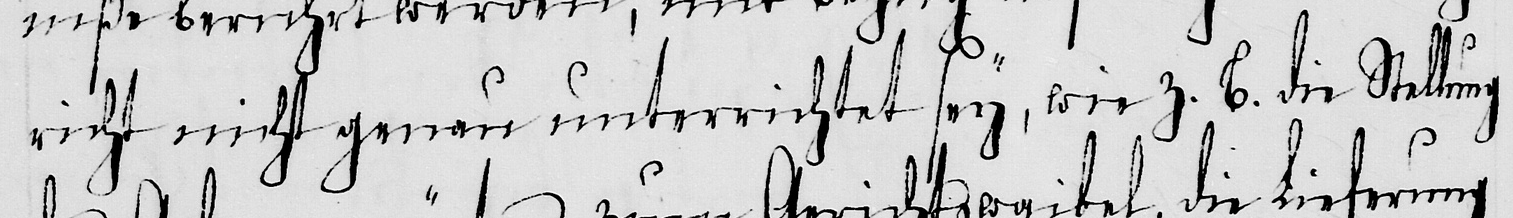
richt nicht genau unterrichtet sey, wie z.B. die Stellung
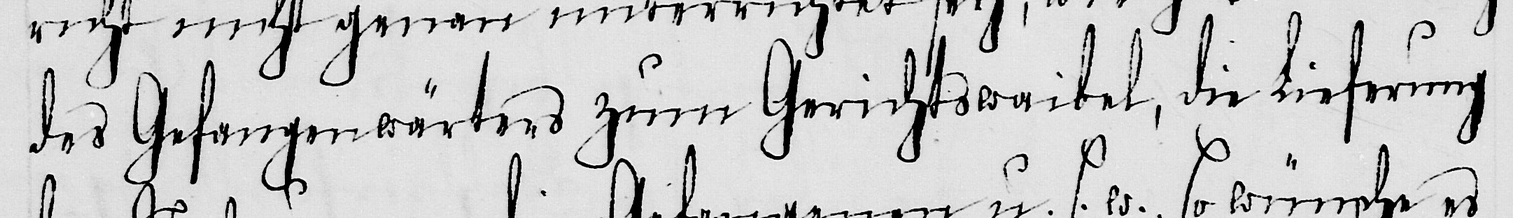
des Gefangenwärtes zum Gerichtswaibel, die Lieferung
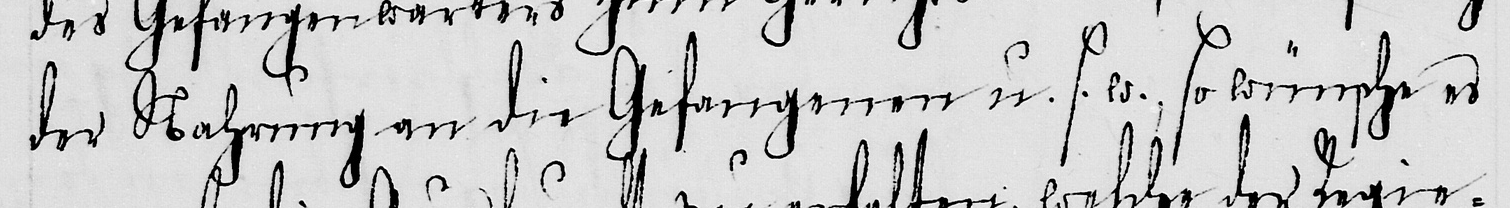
der Nahrung an die Gefangenen u. s. w., so wünsche es
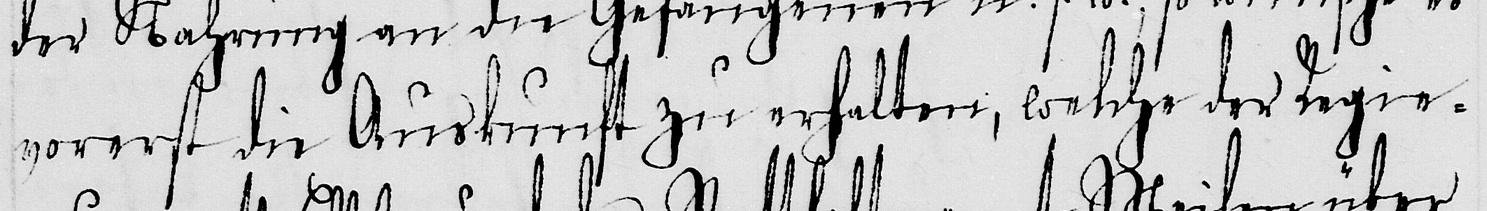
vorerst die Auskunft zu erhalten, welche der Regie¬
